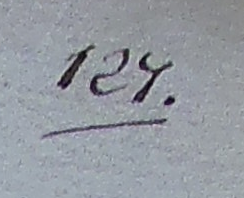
127.
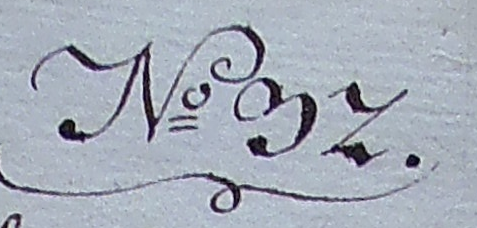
No͇ 32.
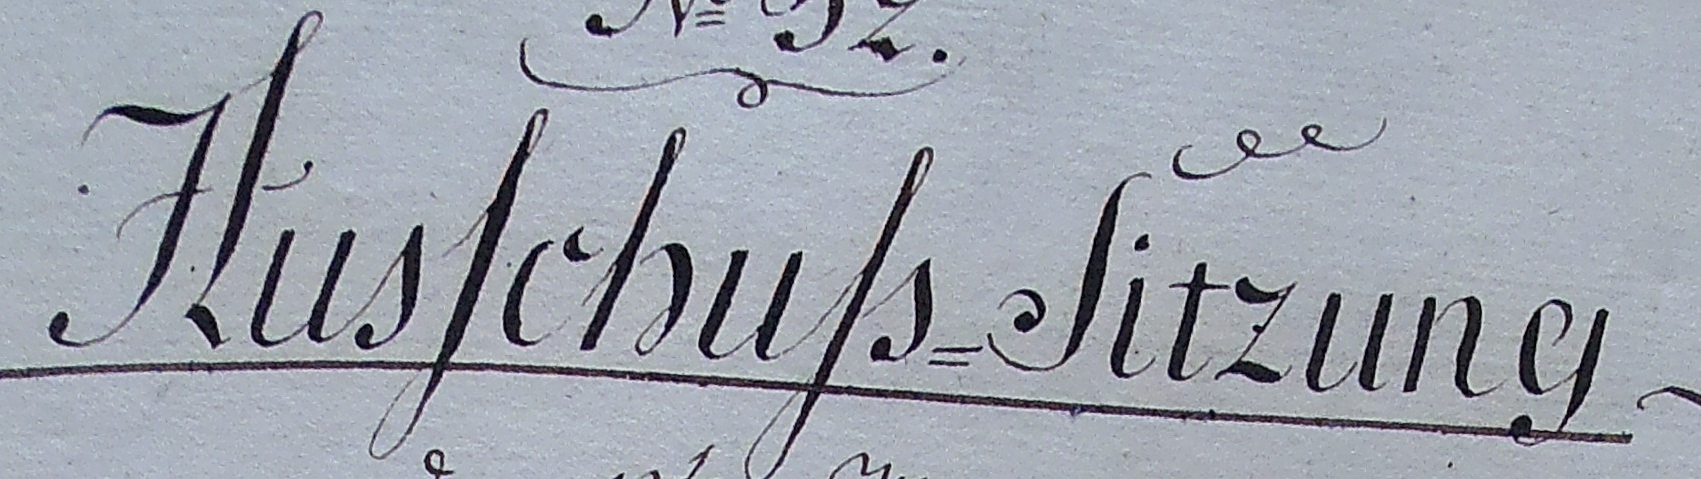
Ausschuss‗Sitzung
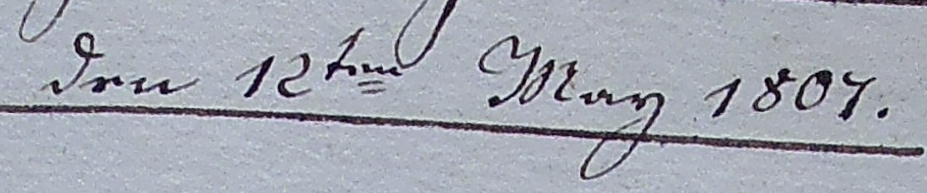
den 12te͇n May 1807.
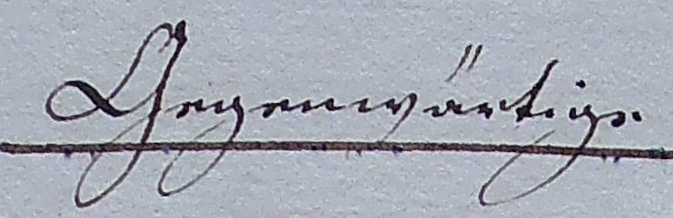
Gegenwärtige
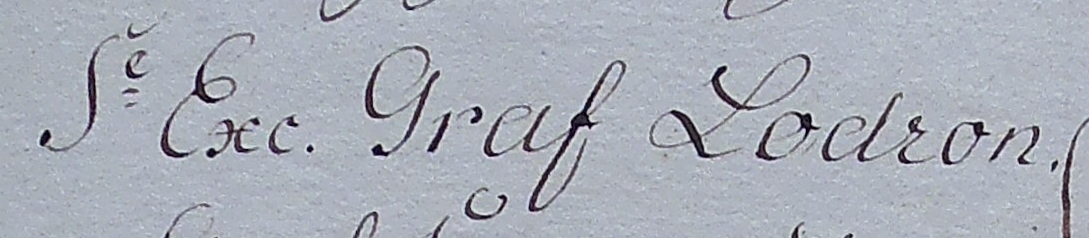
Se͇ Exc. Graf Lodron.
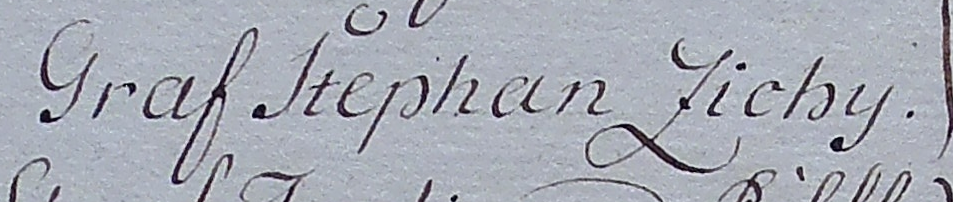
Graf Stephan Zichy.
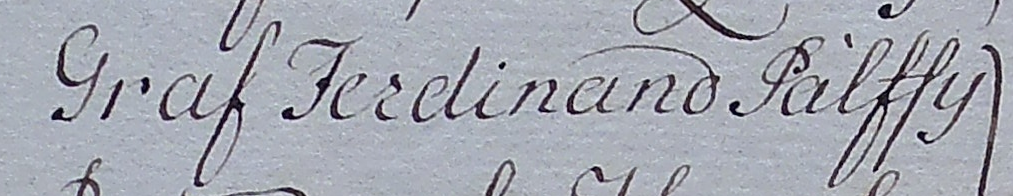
Graf Ferdinand Pàlffy
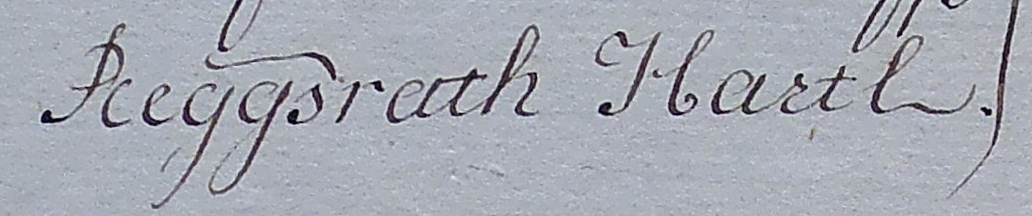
Reg͞gsrath Hartl.
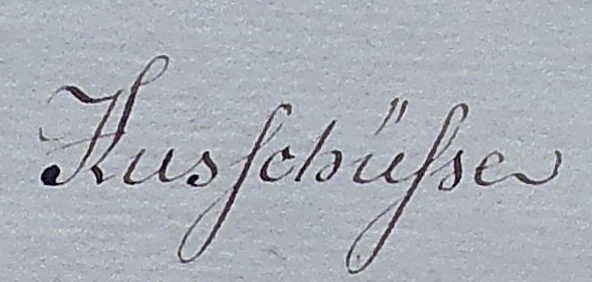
Ausschüsse
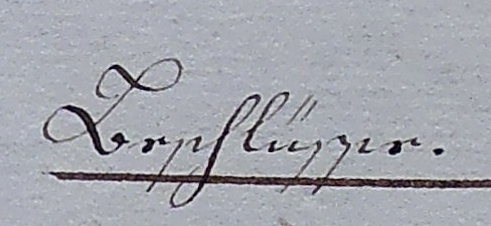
Beschlüsse.
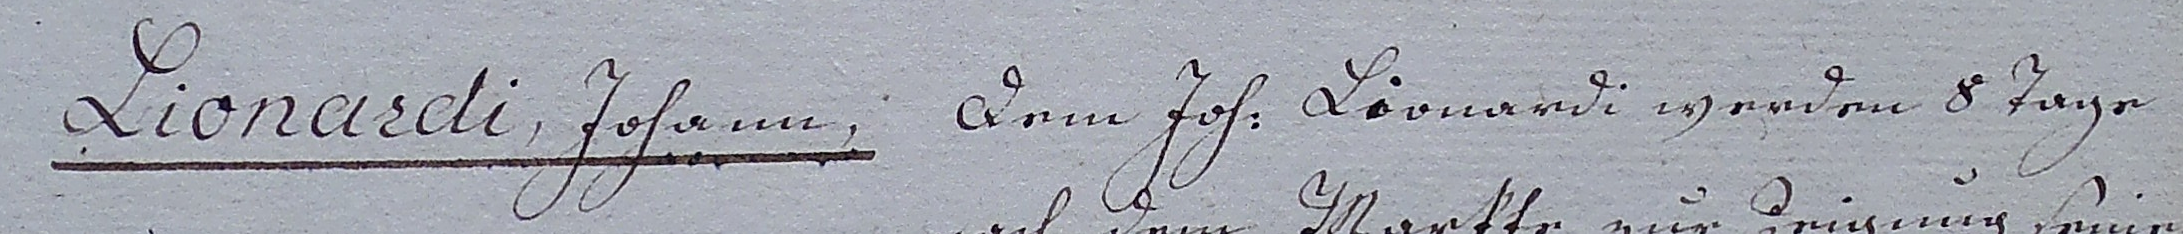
Lionardi, Johann, Dem Joh: Lionardi werden 8 Tage
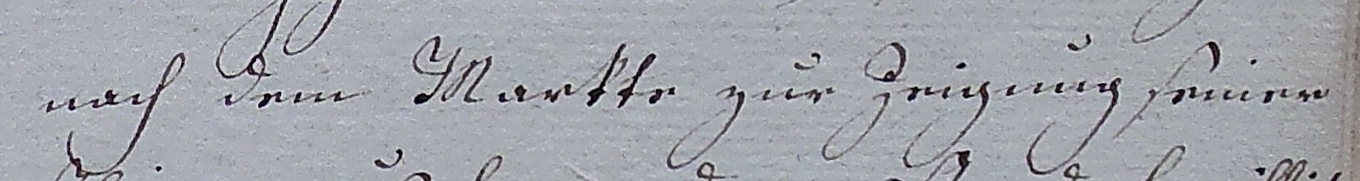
nach dem Markte zur Zeigung seiner
